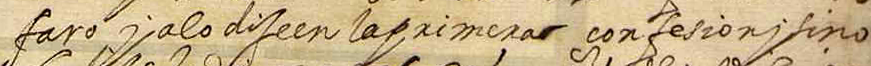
faro ya lo diJe en la primera confesion y sino
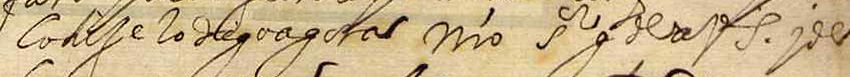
lo diJe lo digo agora nr̄o sor gde a V S. y de
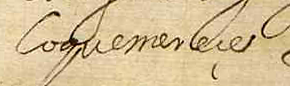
lo que merece
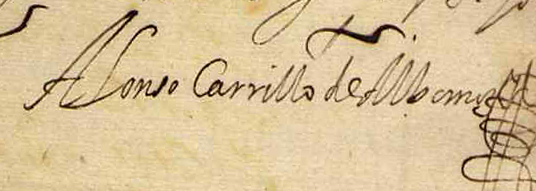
ALonso Carrillo de Albornoz
